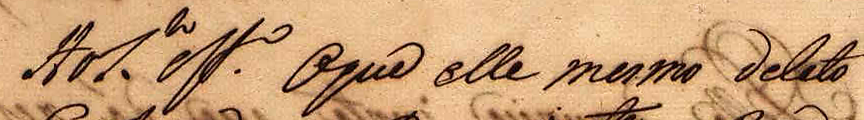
Ao s.to off.o O que elle mesmo delato
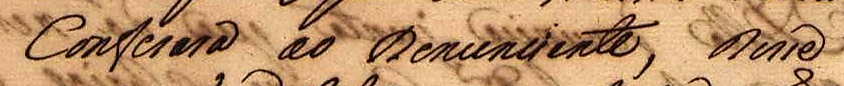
Confesara ao Denunciente, Disse
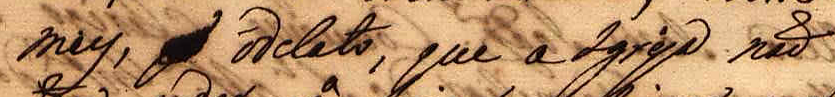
mais, p̄ o delato, que a Igreja naõ
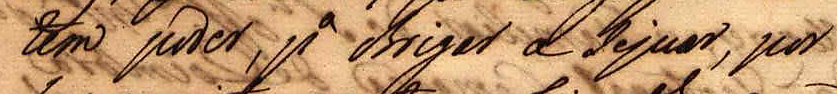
tem poder, p.a obrigar a Iejuar, por
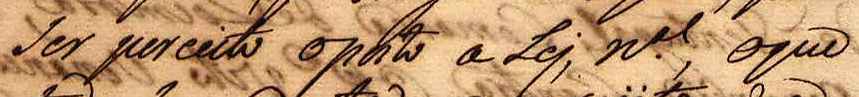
ser perceito oposto a Lej, n.al, o que
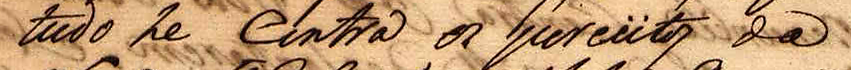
tudo he Contra os perceitos da
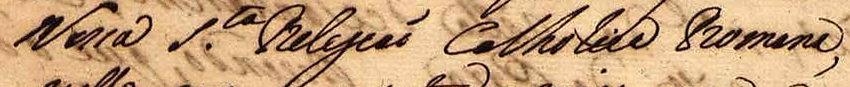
Nossa s.ta Religiaõ Catholica Romana,
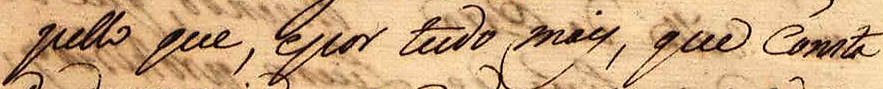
pello que, e por tudo mais, que consta
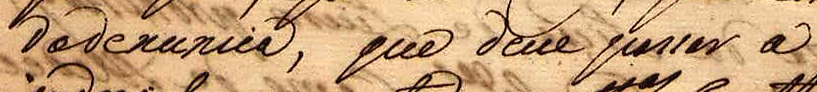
da denuncia, que deue passar a
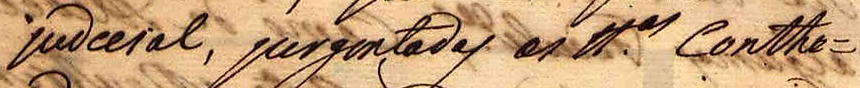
judicial, perguntadas as tt.as conthe
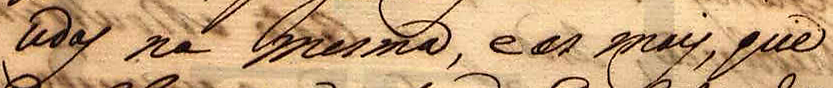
udas na mesma, e as mais, que
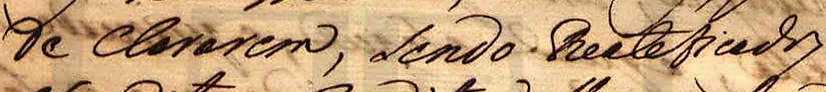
declararem, sendo Reateficados
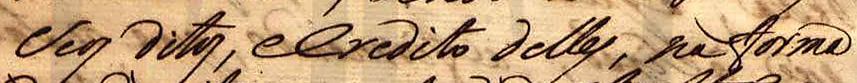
seos ditos, e credito delles, na forma
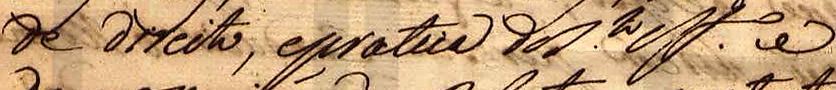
de direito, e pratica do s.to off.o e
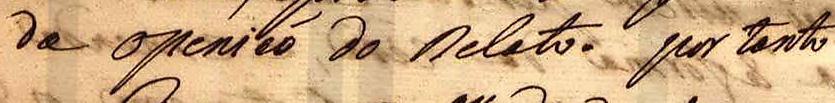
da openiaõ do Delato. portanto
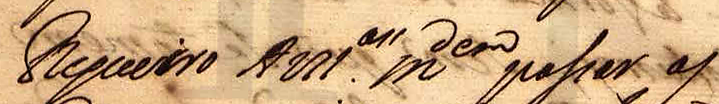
Requeiro A vss.as m.dem passar as
